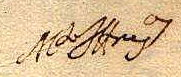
Mto Illre Sor
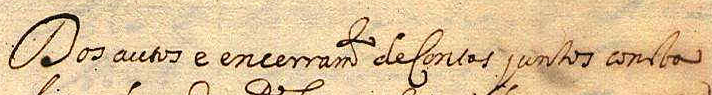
Dos autos e encerramto de Contas juntos consta
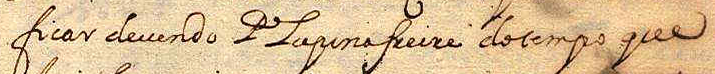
ficar deuendo Po Lupina freire do tempo que
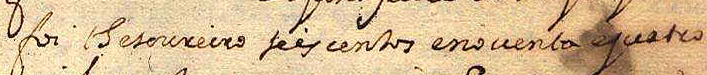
foi thesoureiro seiscentos e nouenta e quatro
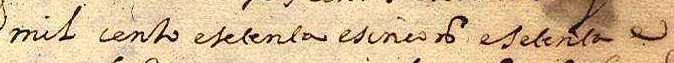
mil cento e setenta e sinco rs̄ e setenta e
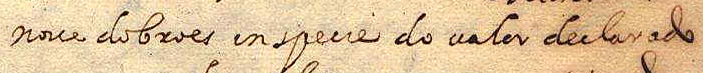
noue dobroes in specie do ualor declarado
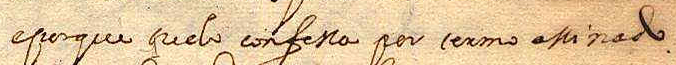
e porque tudo confessa por termo assinado
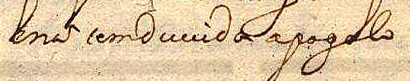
e naõ tem duuida a pagalo
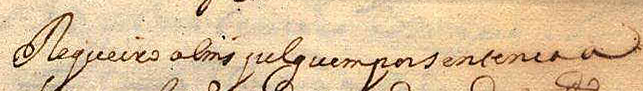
Requeiro a vms̄ julguem por sentença a
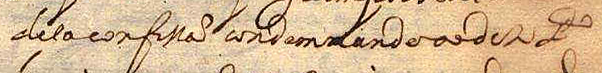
dita confissaõ condemnando ao dito Po
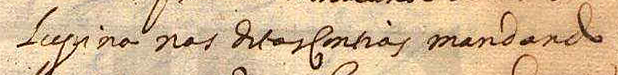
Lupina nas ditas Contias mandando
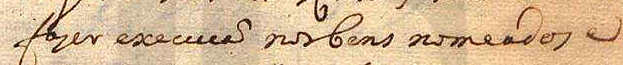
fazer execuçaõ nos bens nomeados e
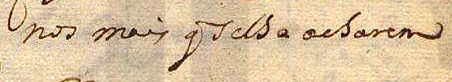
nos mais q̄ se lhe acharem
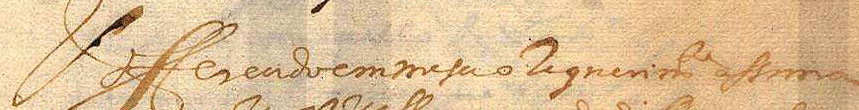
& offerecido em mesa o Requerimto assima
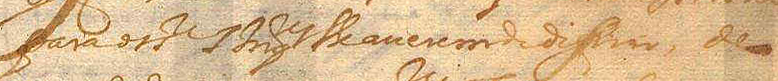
para os sres Inqres lhe auerem de diffirir, de
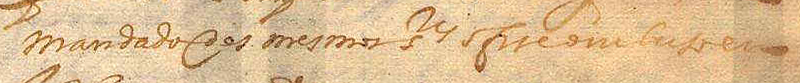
mandado dos mesmos sres o fis concluso eu
